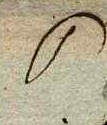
F
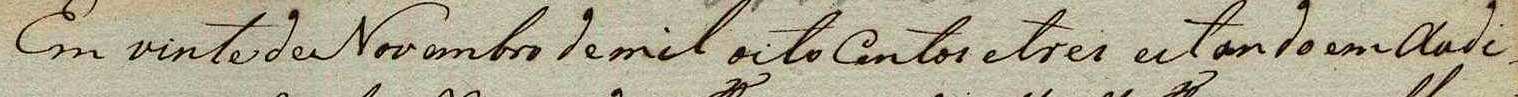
Em vinte de Novembro de mil oitocentos e tres estando em audi
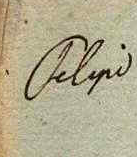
Felipe
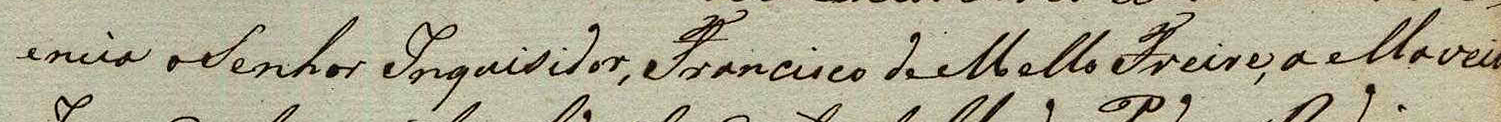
encia o Senhor Inquisidor, Francisco de Mello Freire, a ella veio
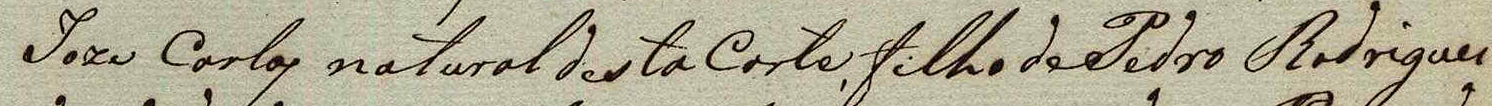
Ioze Carlos, natural desta Corte, filho de Pedro Rodrigues
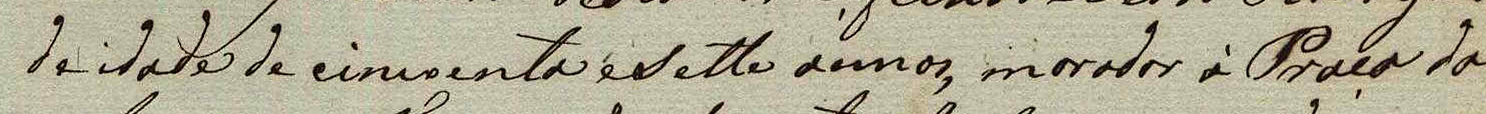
de idade de cincoenta e sette annos, morador à Praça da
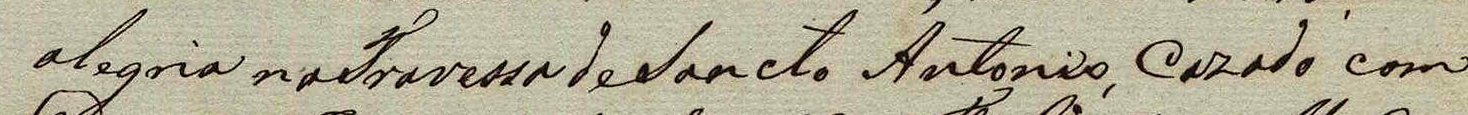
alegria na Travessa de Sancto Antonio, Cazado com
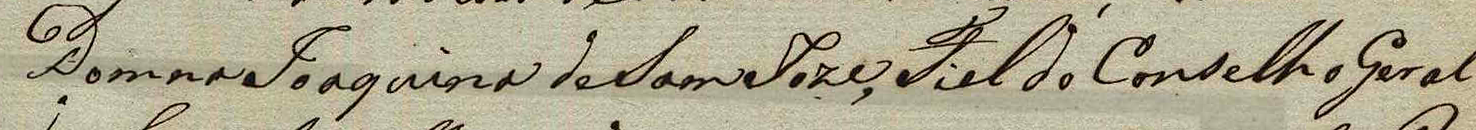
Domna Ioaquina de Sam Ioze, Fiel do Conselho Geral
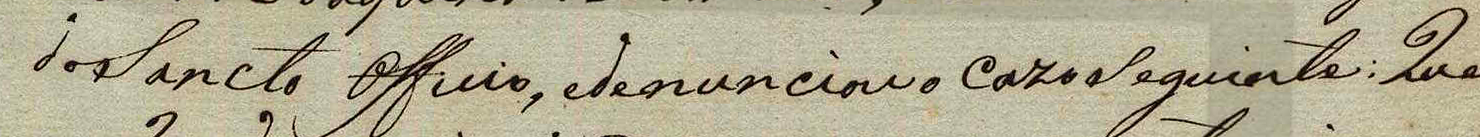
do Sancto Officio, e denunciou o cazo seguinte: Que
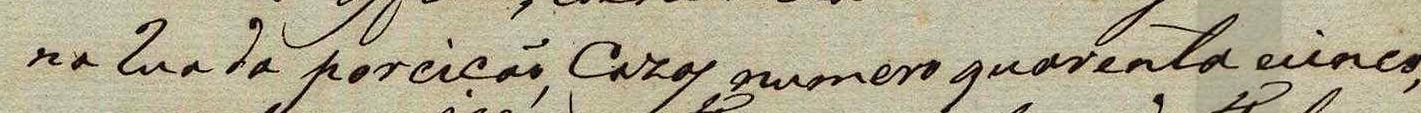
na Rua da porciçaõ Cazas numero quarenta e cinco,
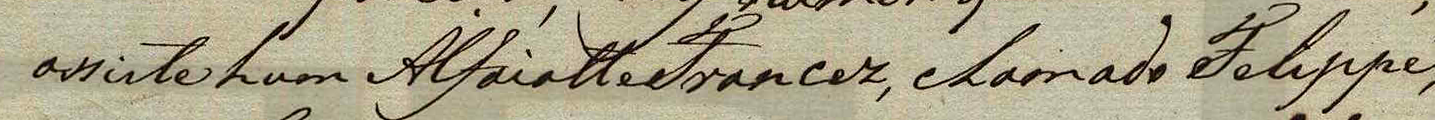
assiste hum Alfaiatte Francez, chamado Felippe,
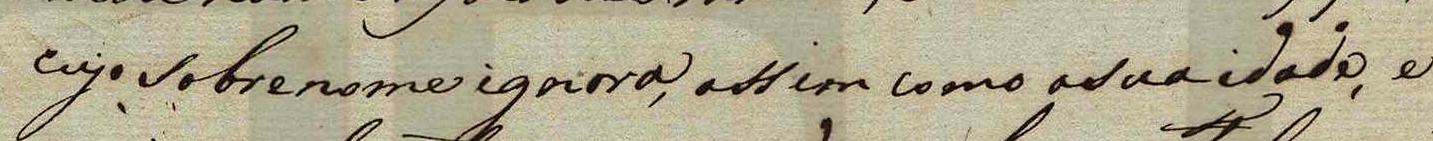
cujo sobrenome ignora, assim como a sua idade, e
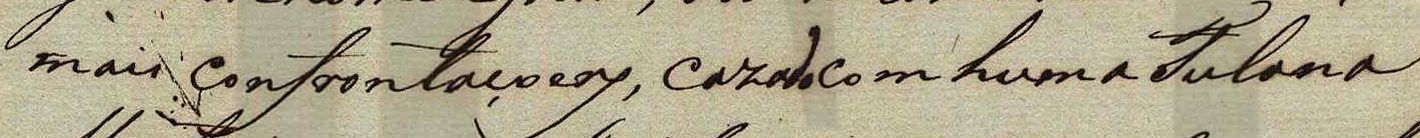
mais confrontaçoens, cazado com huma Fulana
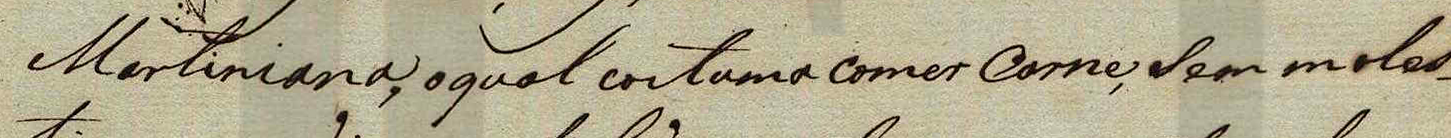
Martiniana, o qual costuma comer carne, sem moles
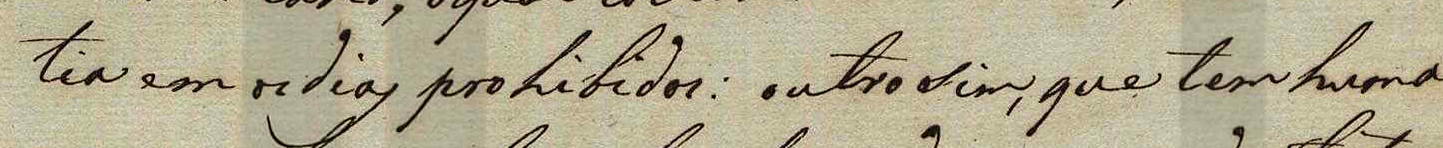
tia em os dias prohibidos: outrosim, que tem huma
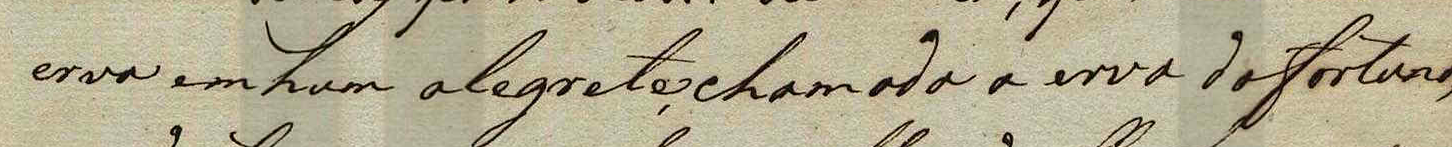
erva em hum alegrete, chamada a erva da fortuna,
